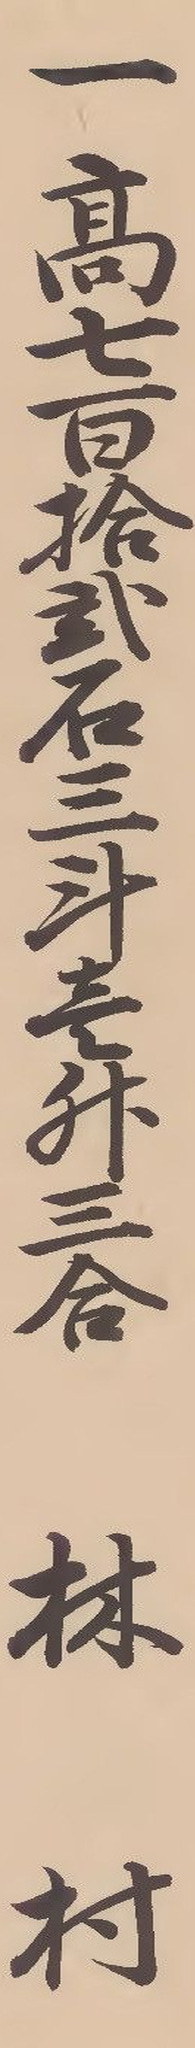一高七百拾弐石三斗壱升三合林村
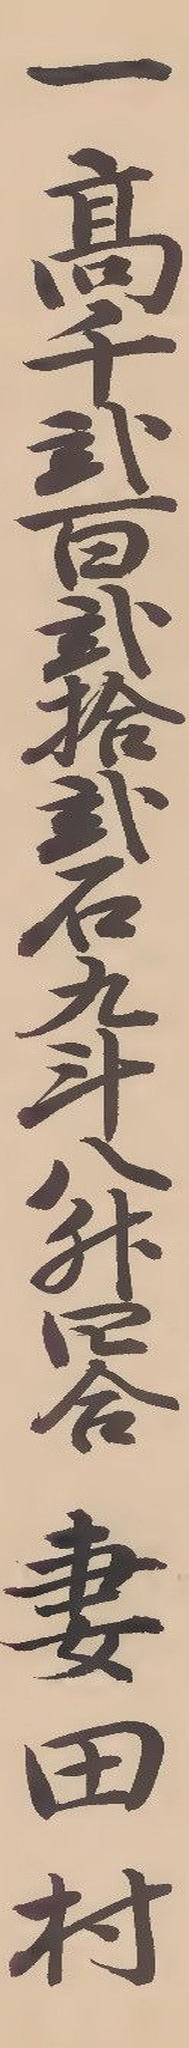一高千弐百弐拾弐石九斗八升四合妻田村
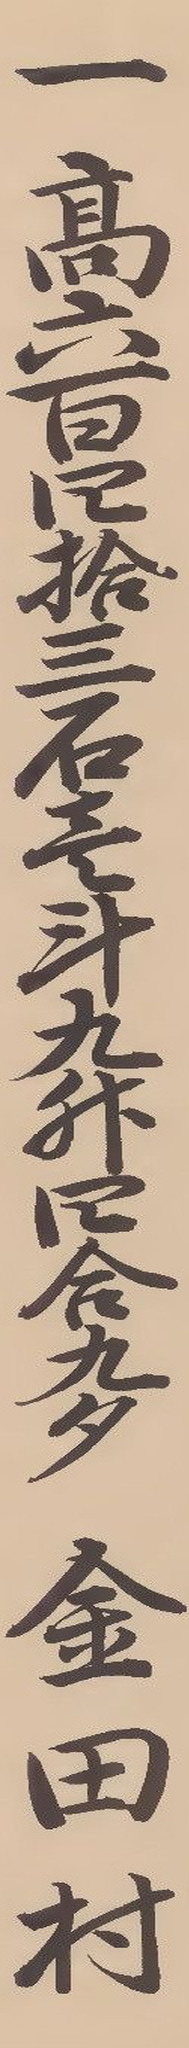一高六百四拾三石壱斗九升四合九勺金田村
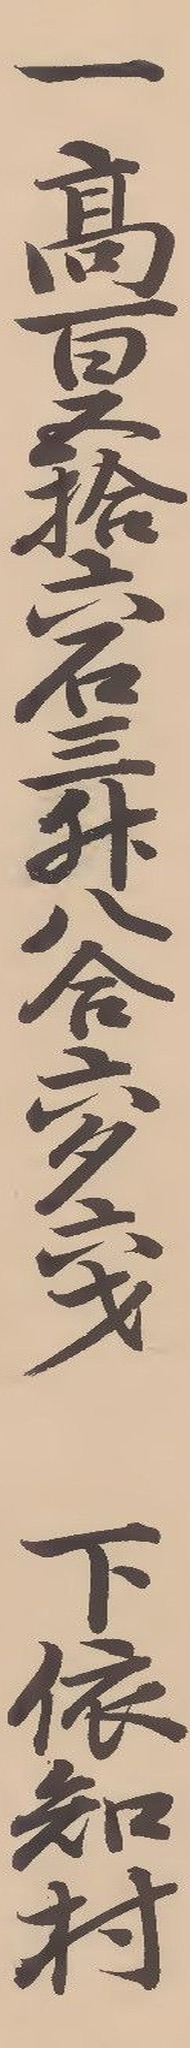一高百五拾六石三升八合六勺六才下依知村
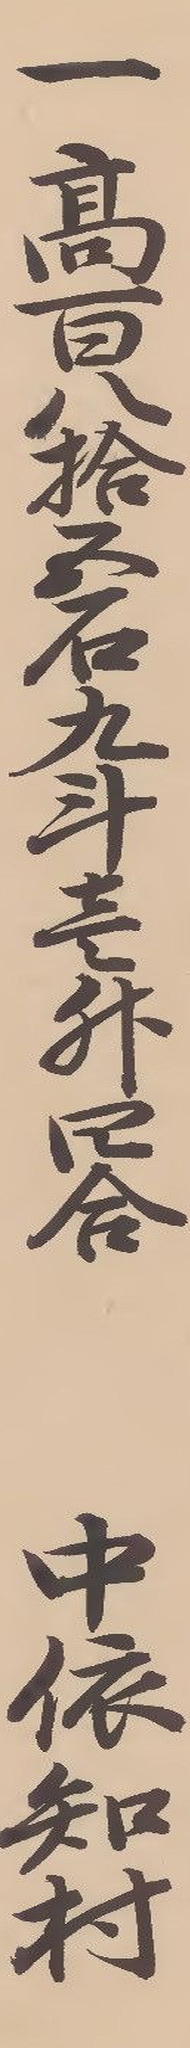一高百八拾五石九斗壱升四合中依知村
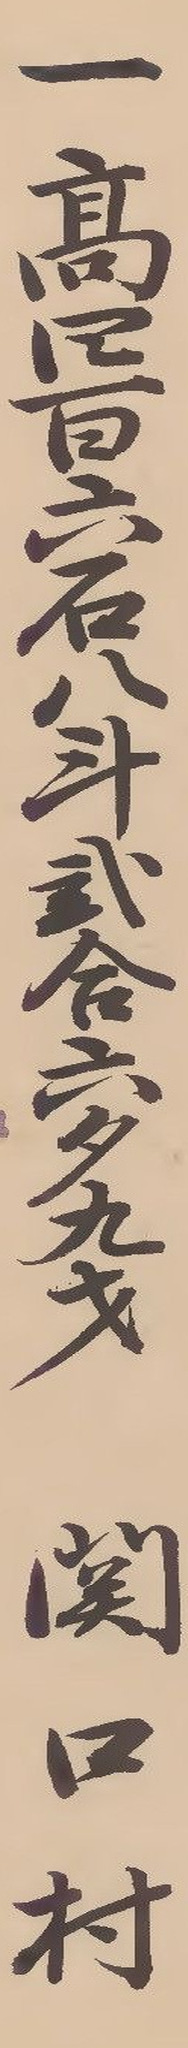一高四百六石八斗弐合六勺九才関口村

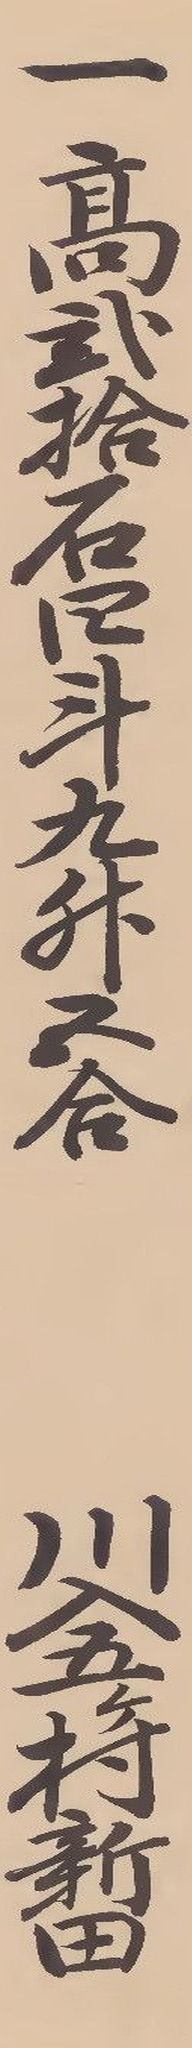一高弐拾石四斗九升五合川入五ヶ村新田
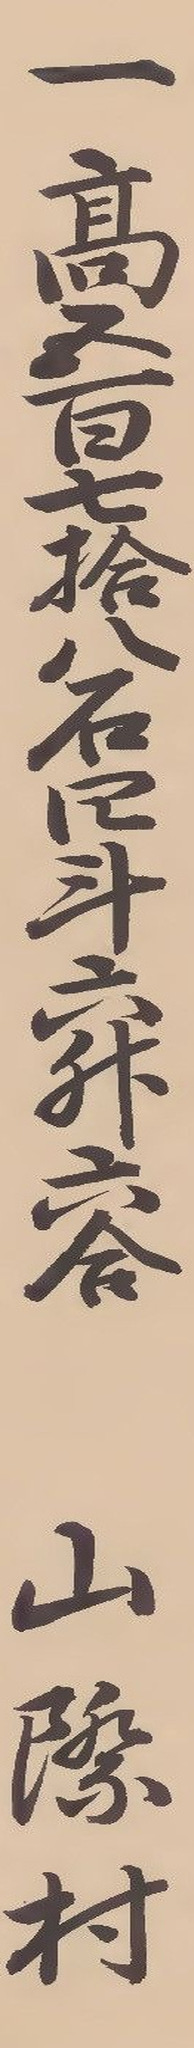一高五百七拾八石四斗六升六合山際村
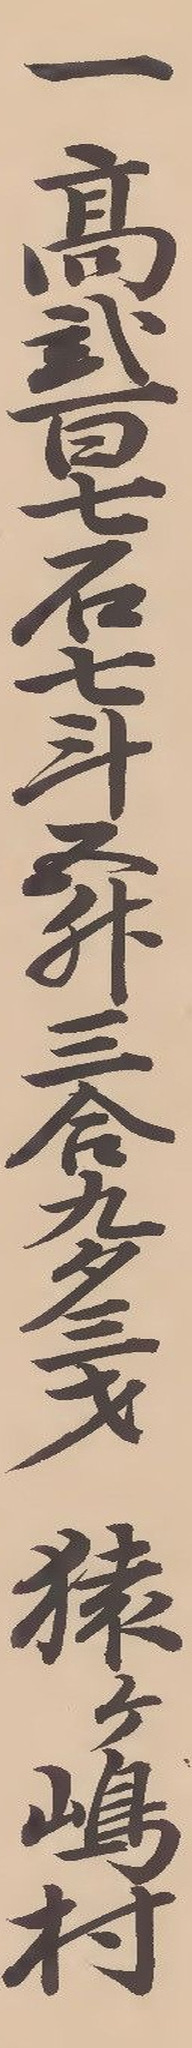一高弐百七石七斗五升三合九勺三才猿ヶ嶋村
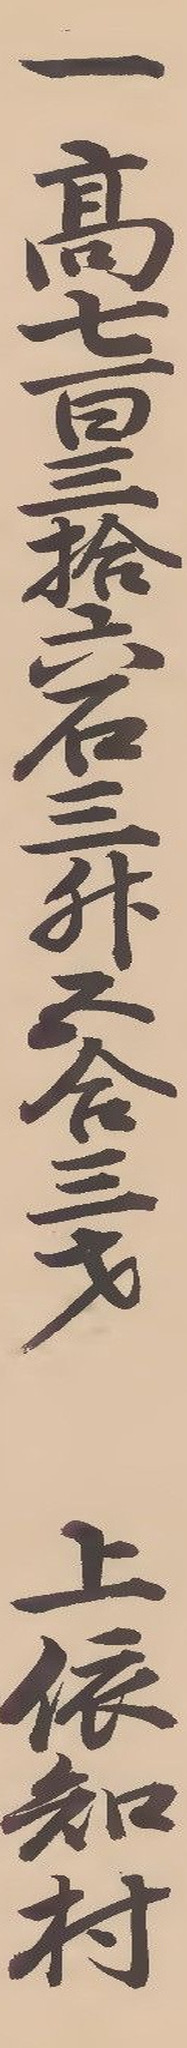一高七百三拾六石三升五合三才上依知村
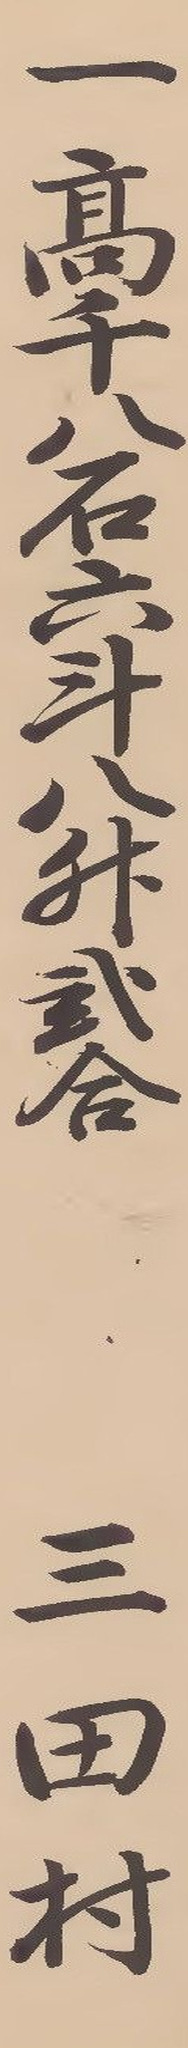一高千八石六斗八升弐合三田村
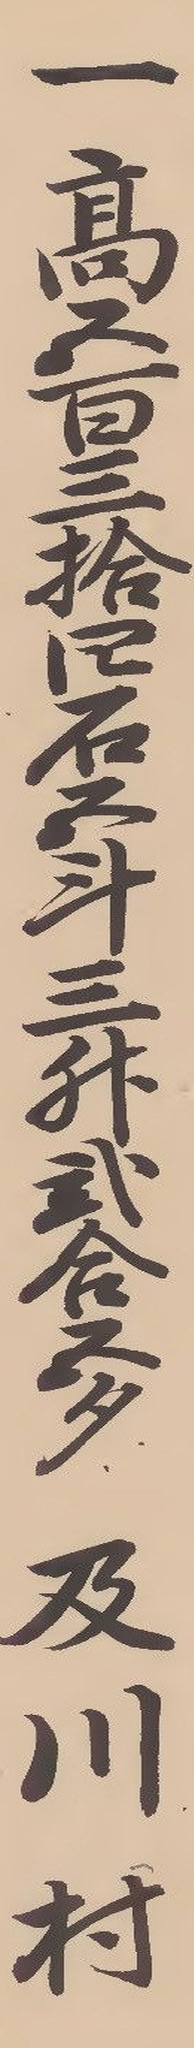一高五百三拾四石五斗三升弐合五勺及川村
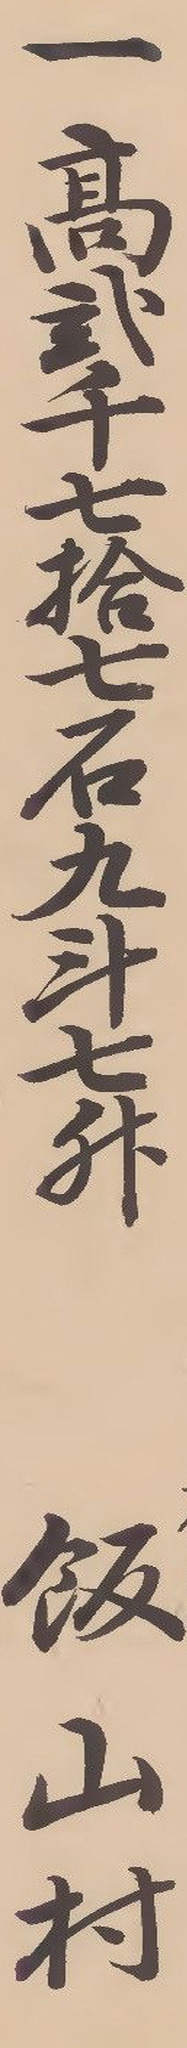一高弐千七拾七石九斗七升飯山村
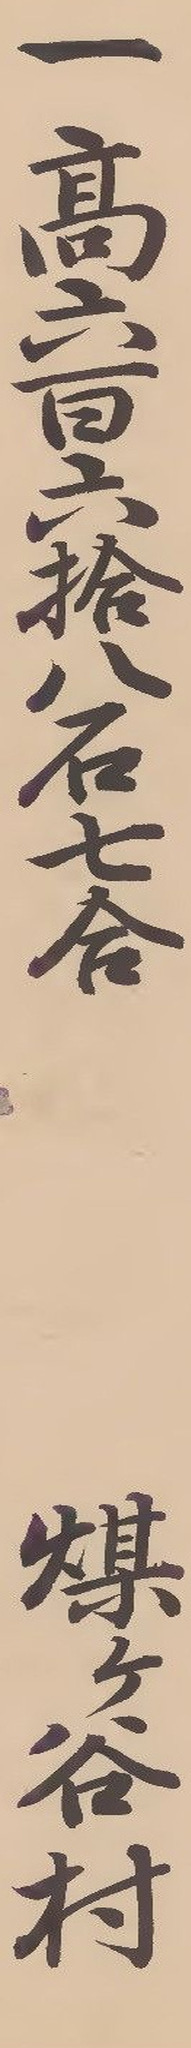一高六百六拾八石七合煤ヶ谷村

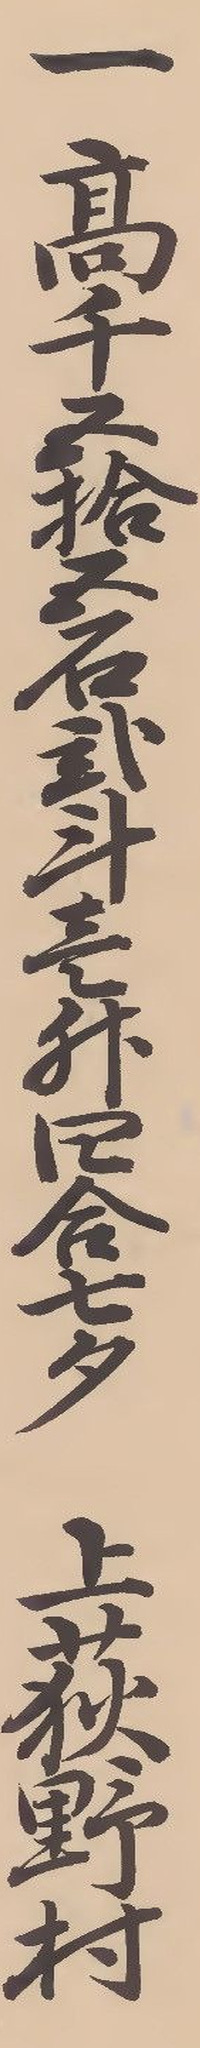一高千五拾五石弐斗壱升四合七勺上荻野村
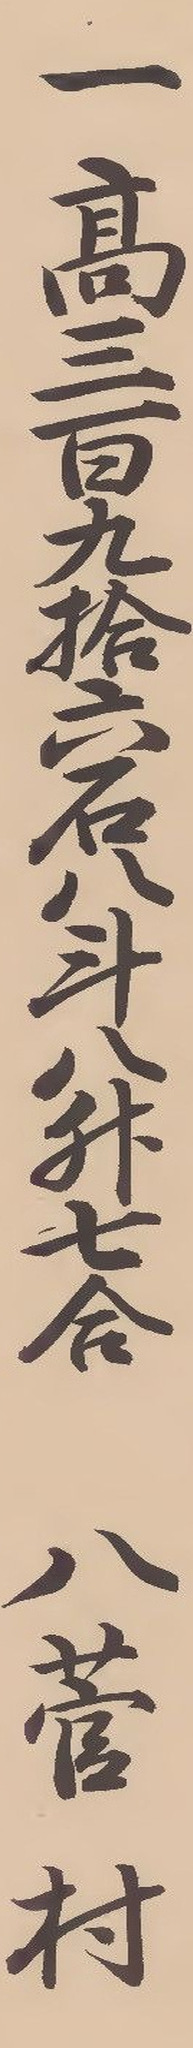一高三百九拾六石八斗八升七合八菅村
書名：相模国郷帳
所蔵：国立公文書館 National Archives of Japan
